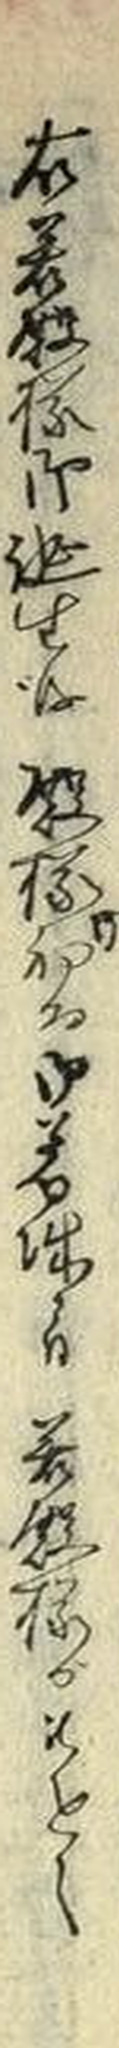右若殿様御誕生後殿様御初而御着城ニ付若殿様ゟ被進之
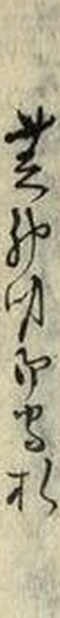芝神明御守札
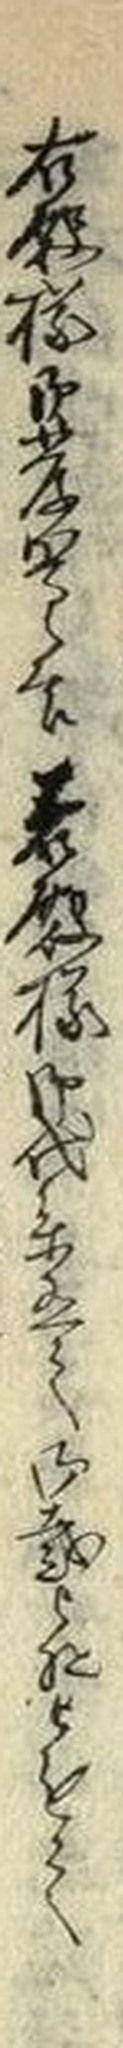右殿様御発駕之節若殿様御代参有之御戴被遊被進之
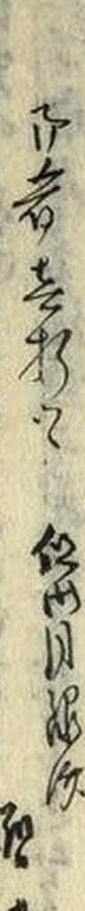御肴壱折ツヽ但御目録済
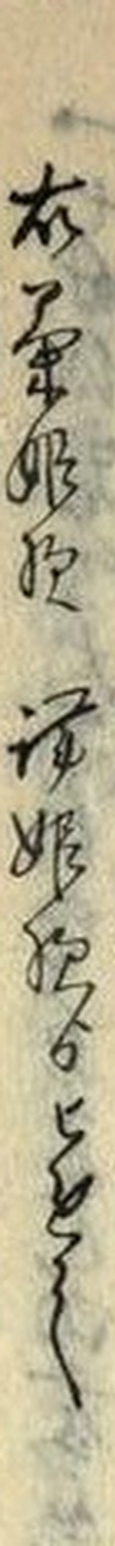右菊姫様謹姫様ゟ被進之
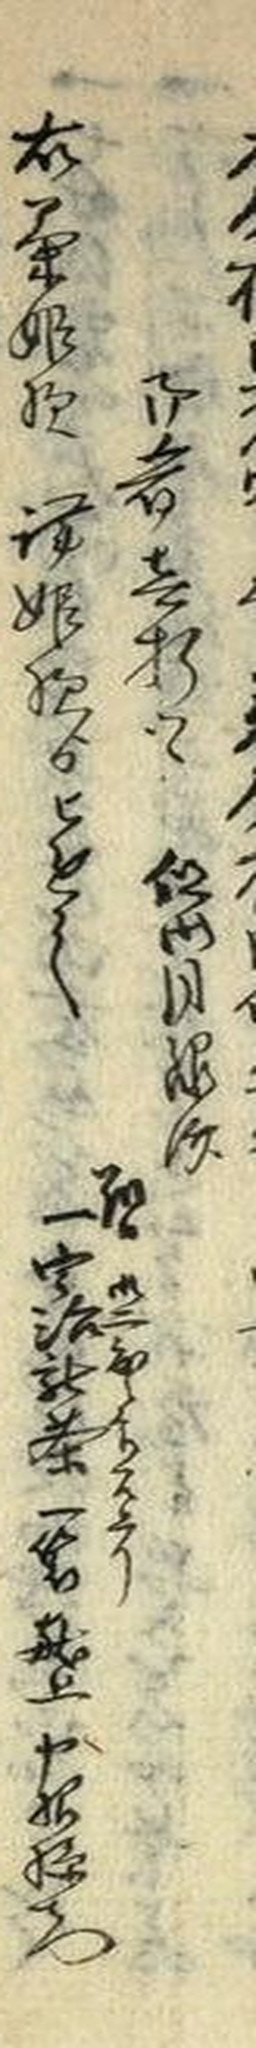右菊姫様謹姫様ゟ被進之
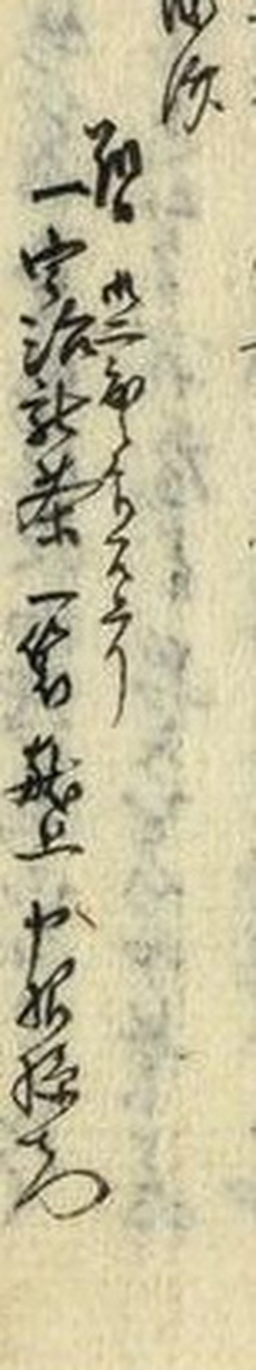一宇治新茶一箱献上中根孫右衛門
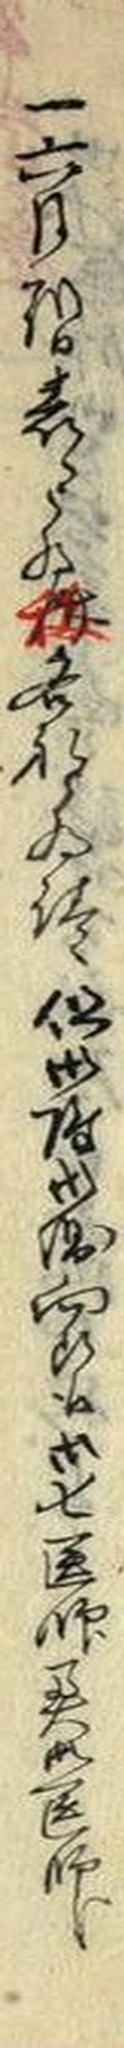一六月朔日表へ被為移各礼被為請候但御附御側向頭取御匙医師奥御医師

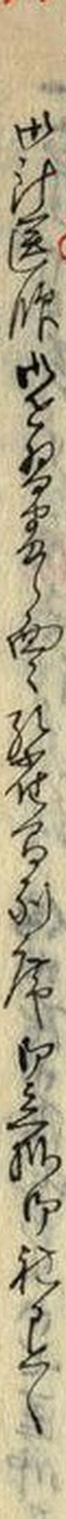御針医師御近習番之面々孔雀間列席御立掛御礼申上候
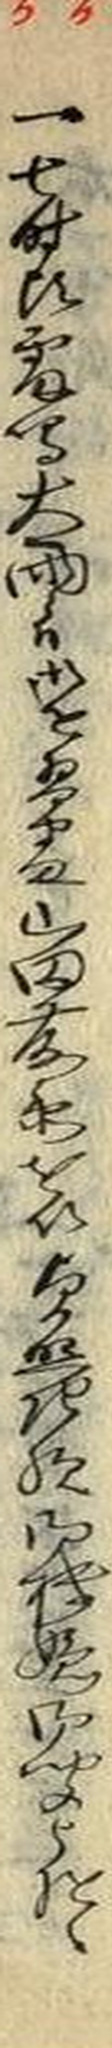一七時頃雷鳴大雨ニ付御近習番山田藤兵衛を以貞照院様御機嫌御聞被遊候
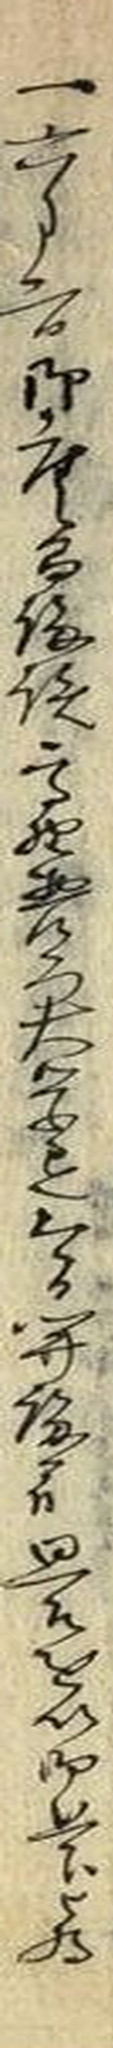一六月二日御座之間講談高野惣左衛門大学申上今日開講ニ付思召を以御上下被為
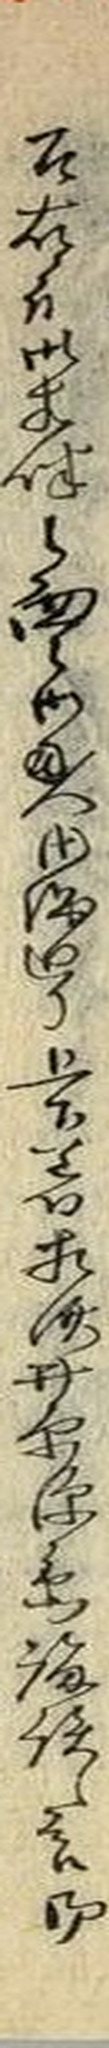召右ニ付御相伴之面々御用人御側廻り上下着相済井原源兵衛講談之節御
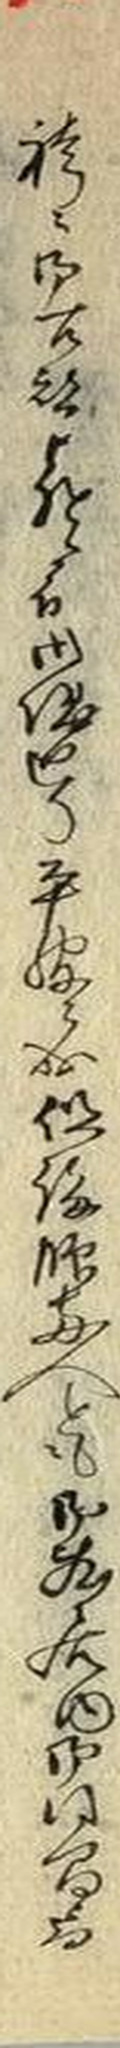袴ニ御召替被遊候ニ付御側廻り平服ニ成但講師両人とも御敷居内御同間ニ而
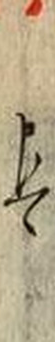申上候
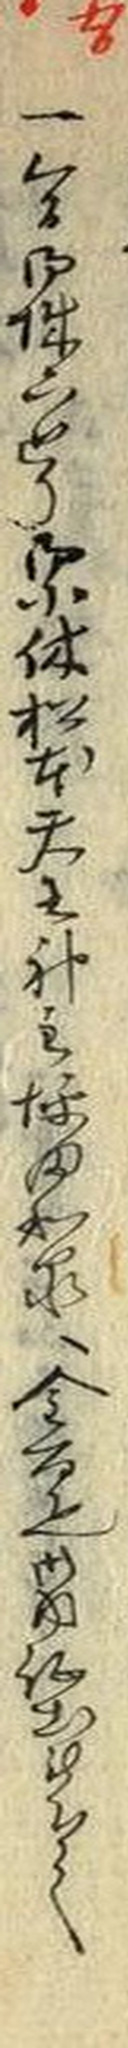一今日御城下廻り御小休松本天王神主坪田和泉へ金百疋御内証出被下之
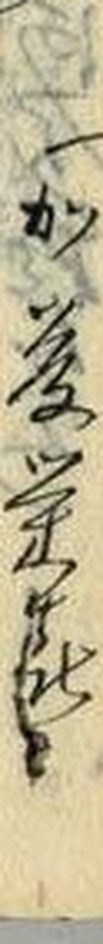加藤栄喜
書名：少傅日録抄（斉承付側向頭取日記、在国）
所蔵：福井県文書館 Fukui Prefectural Archives
